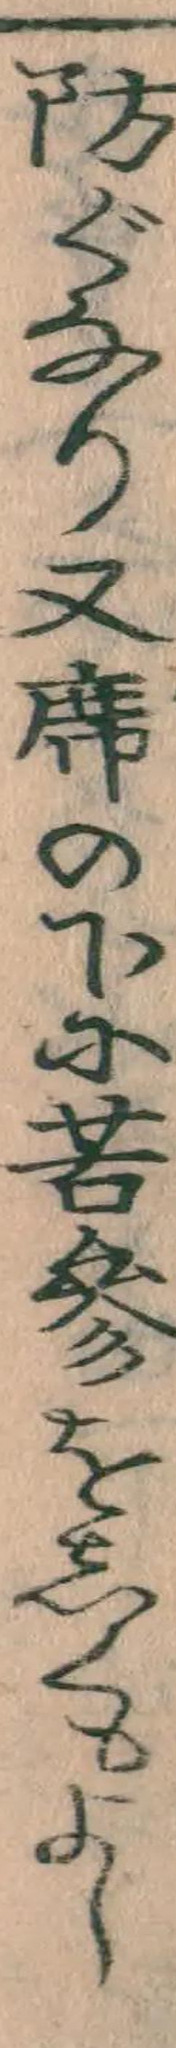防ぐなり又席の下に苦参をしくもよし
